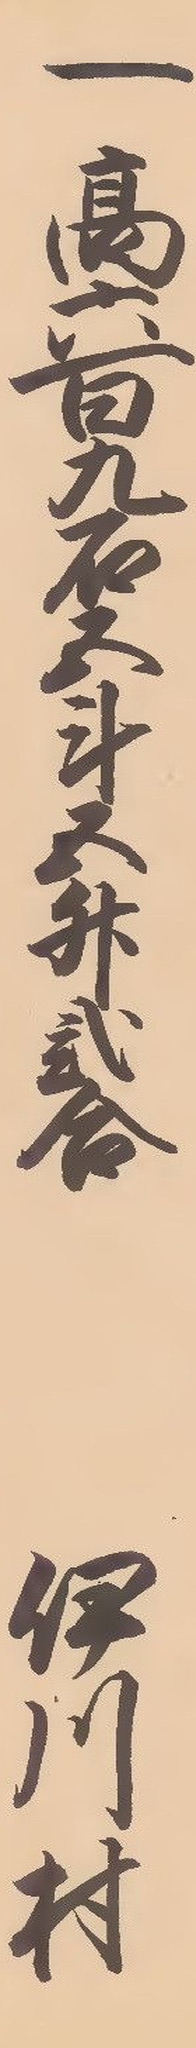一髙六百九石五斗五升弐合伊川村
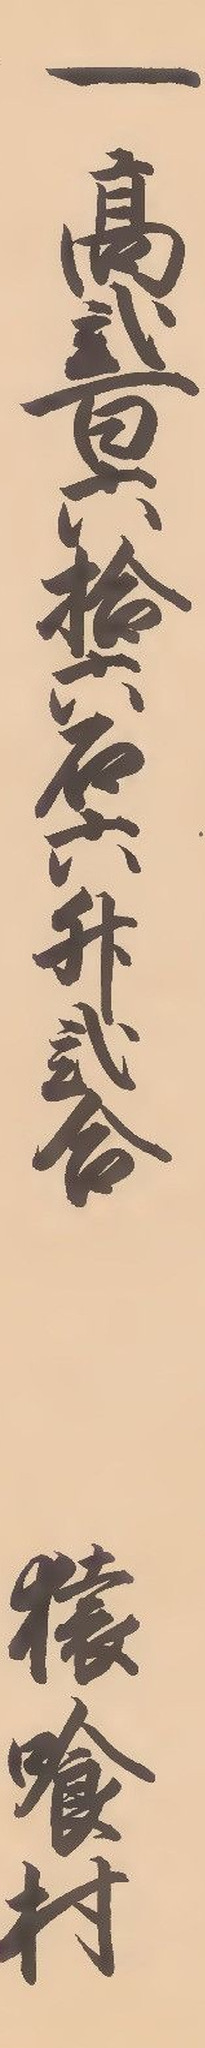一髙弐百六拾六石六升弐合猿喰村
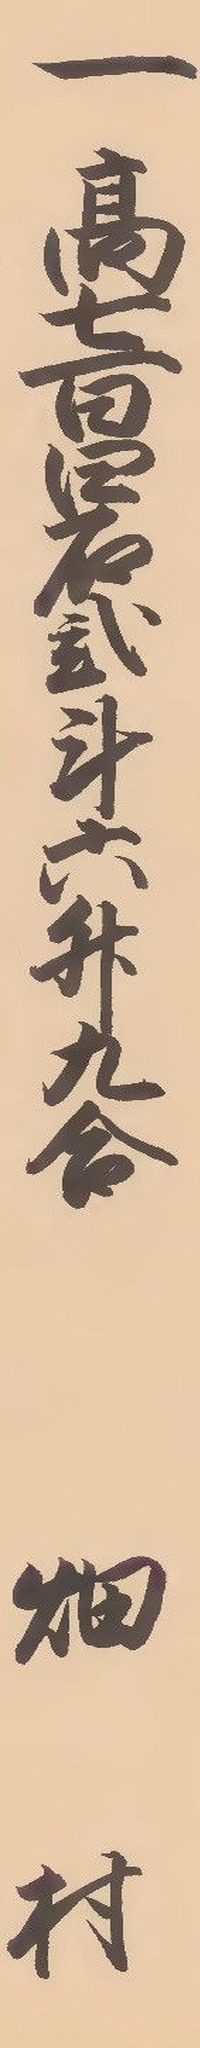一髙七百四石弐斗六升九合畑村
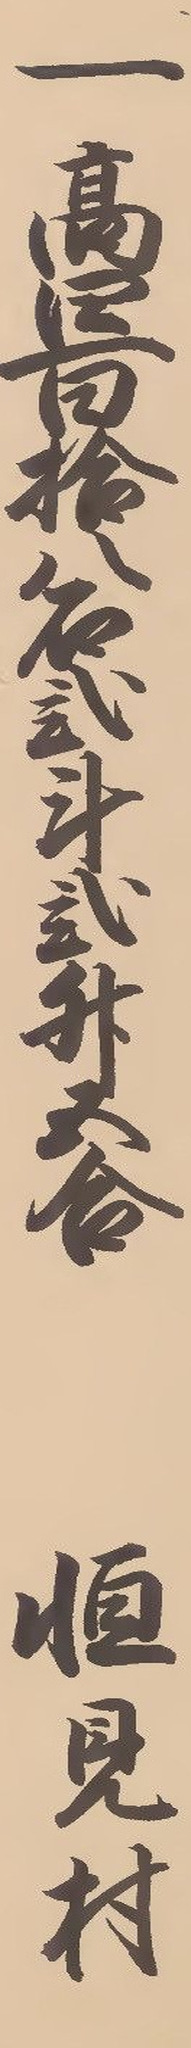一髙四百拾八石弐斗弐升五合恒見村
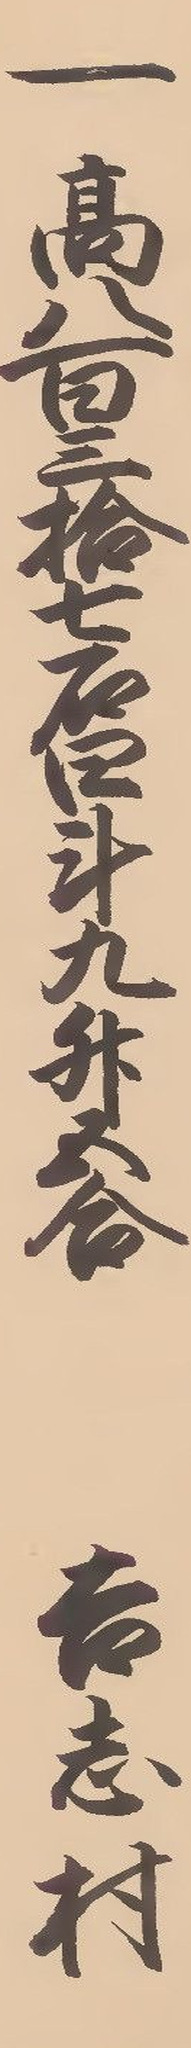一髙八百三拾七石四斗九升五合吉志村
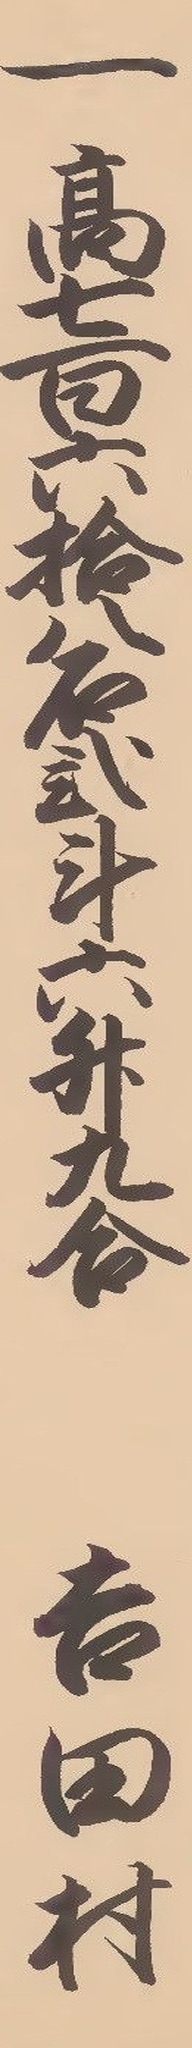一髙七百六拾八石弐斗六升九合吉田村
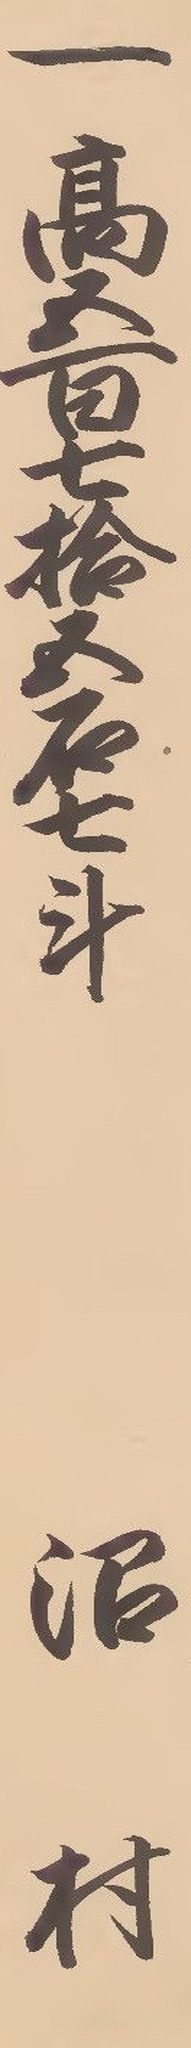一髙五百七拾五石七斗沼村

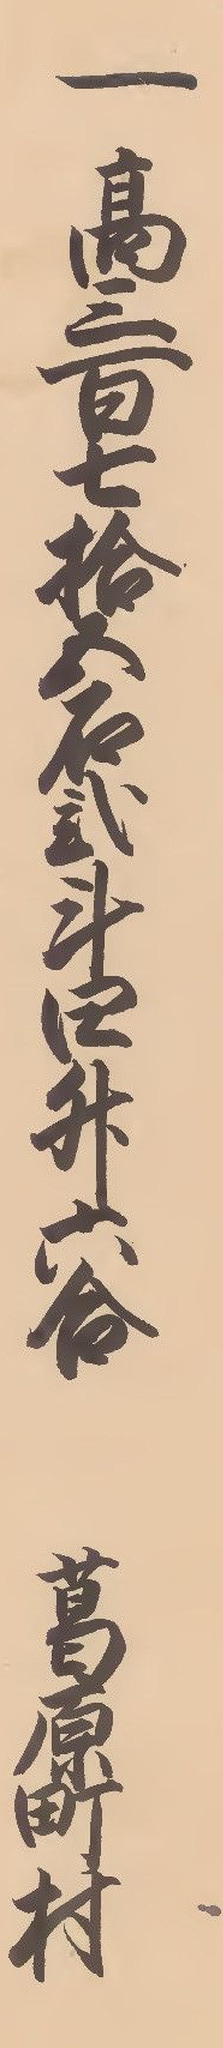一髙三百七拾五石弐斗四升六合葛原町村
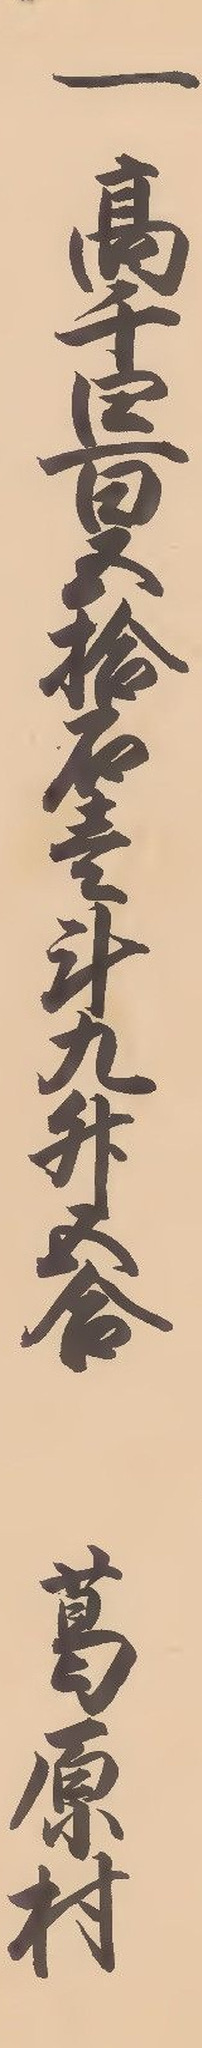一髙千四百五拾石壱斗九升五合葛原村
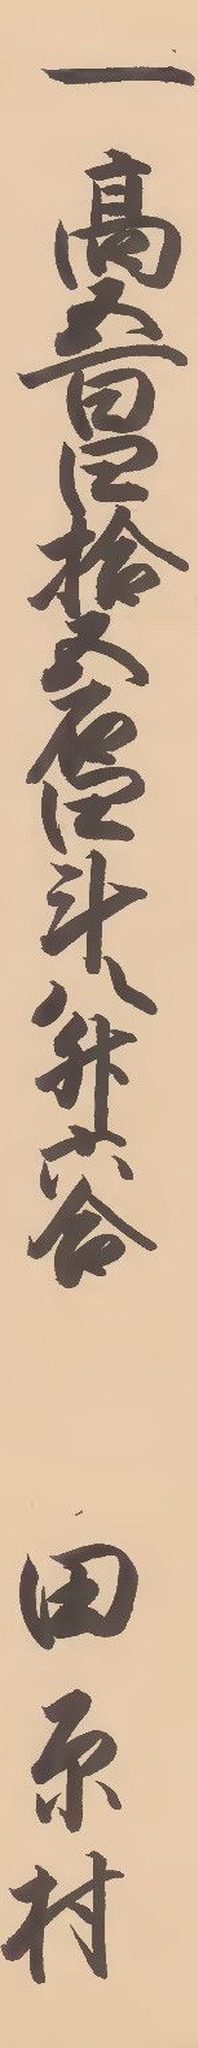一髙五百四拾五石四斗八升六合田原村
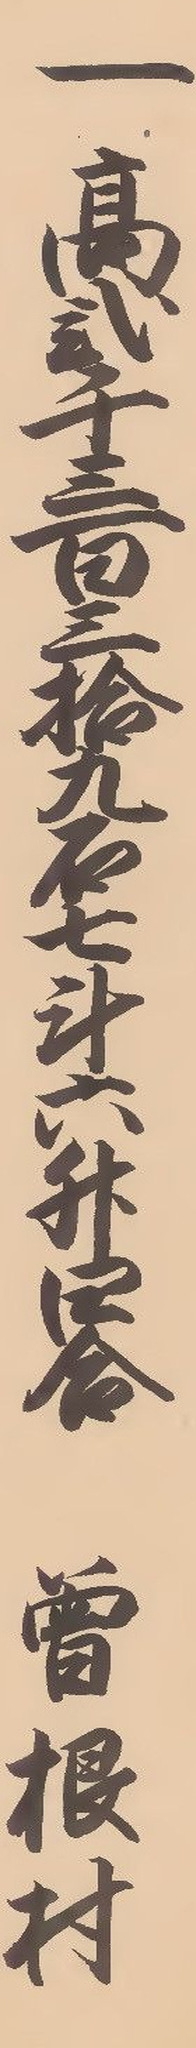一髙弐千三百三拾九石七斗六升四合曽根村
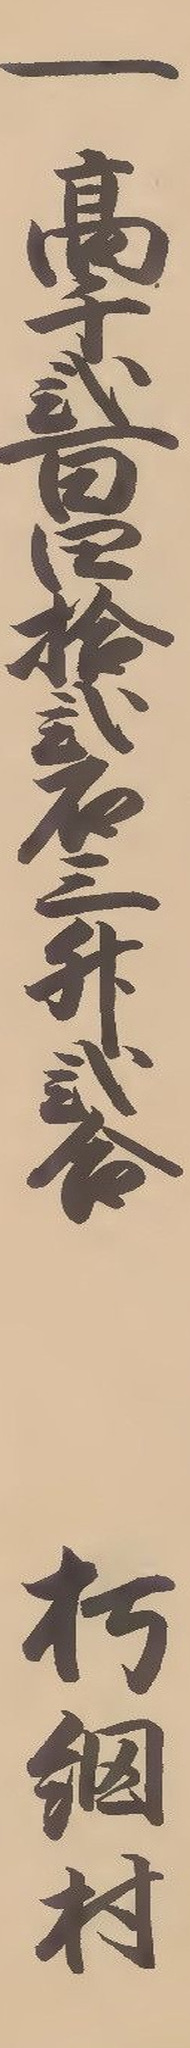一髙千弐百四拾弐石三升弐合朽網村
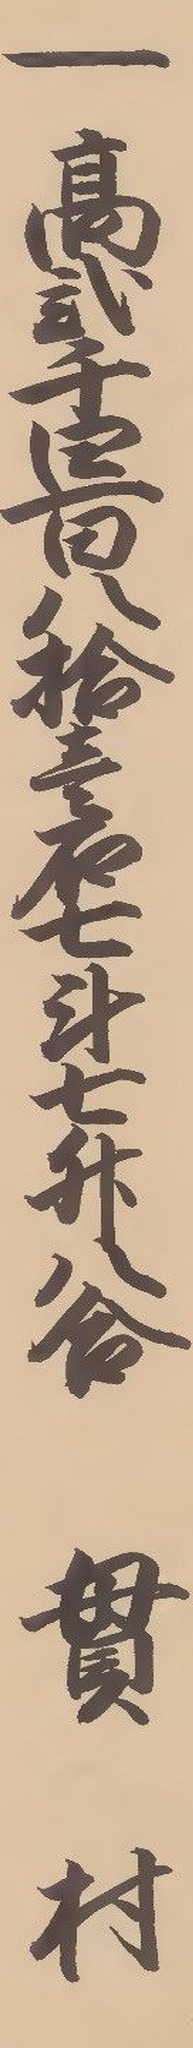一髙弐千四百八拾壱石七斗七升八合貫村
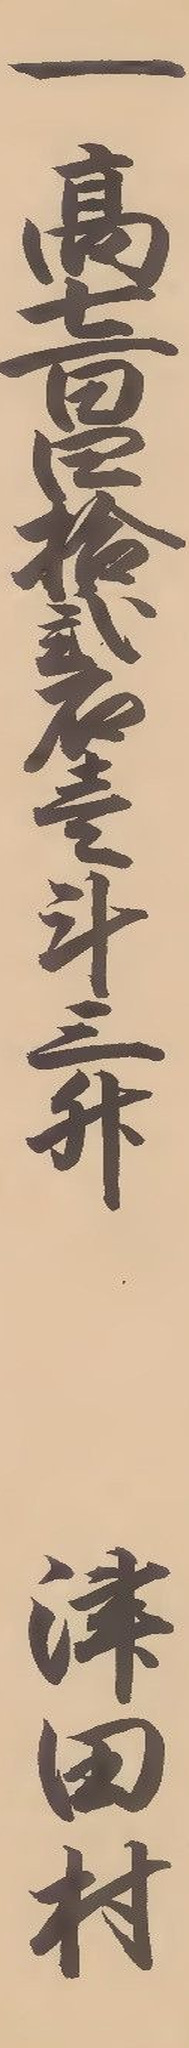一髙七百四拾弐石壱斗三升津田村
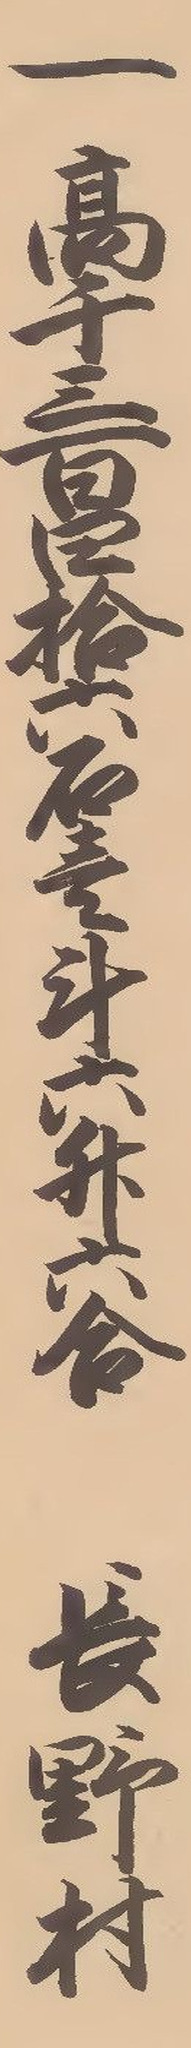一髙千三百四拾六石壱斗六升六合長野村

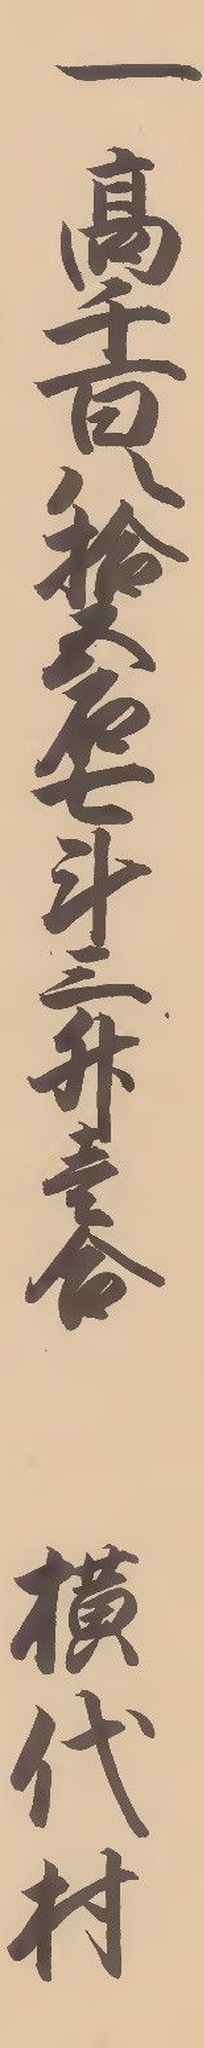一髙千百八拾五石七斗三升壱合横代村
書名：豊前国郷帳
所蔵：国立公文書館 National Archives of Japan
